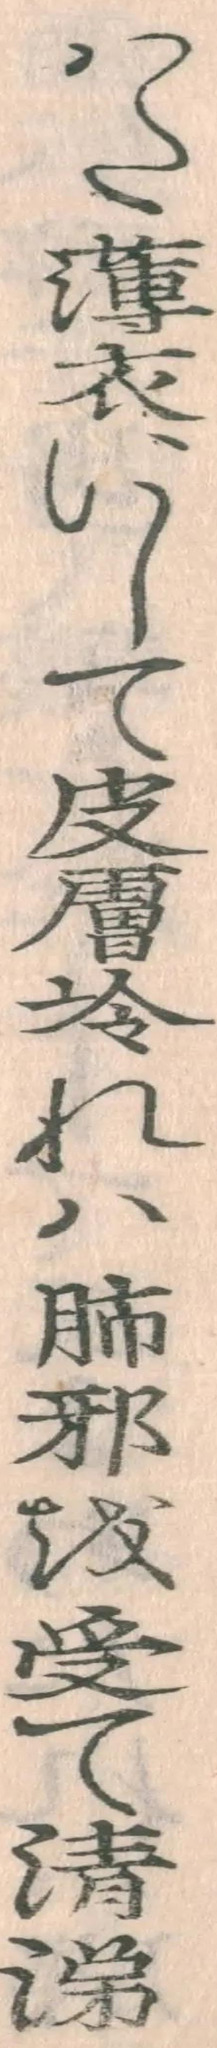はた薄衣にして皮膚冷れは肺邪を受て清涕
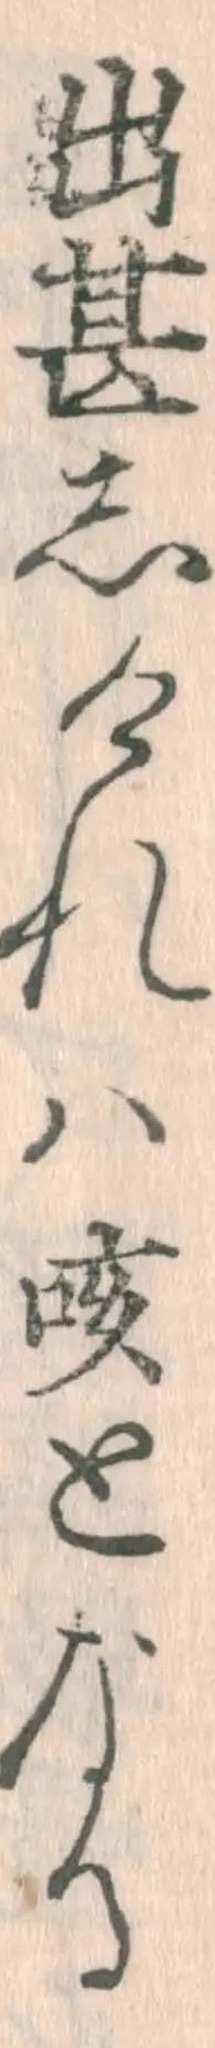出甚しけれは咳となる
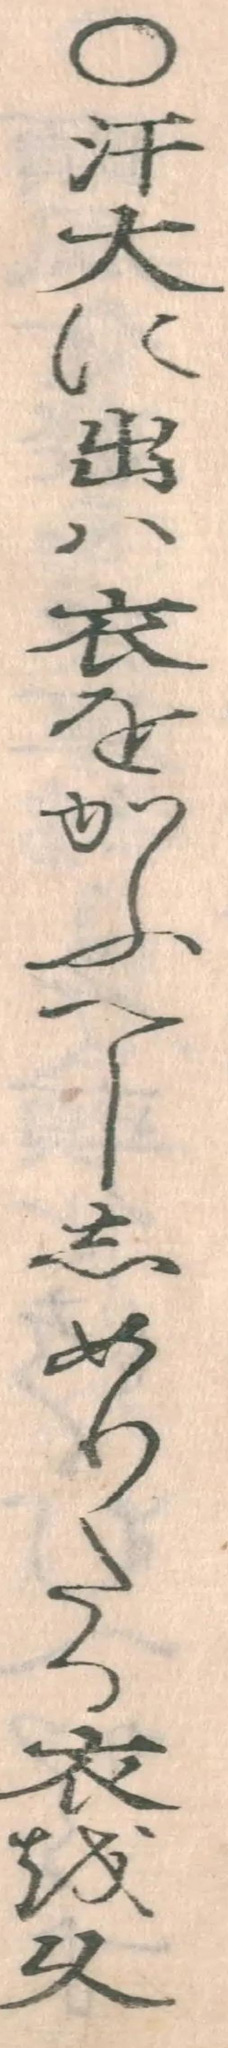〇汗大に出は衣をかふへししめりたる衣を久
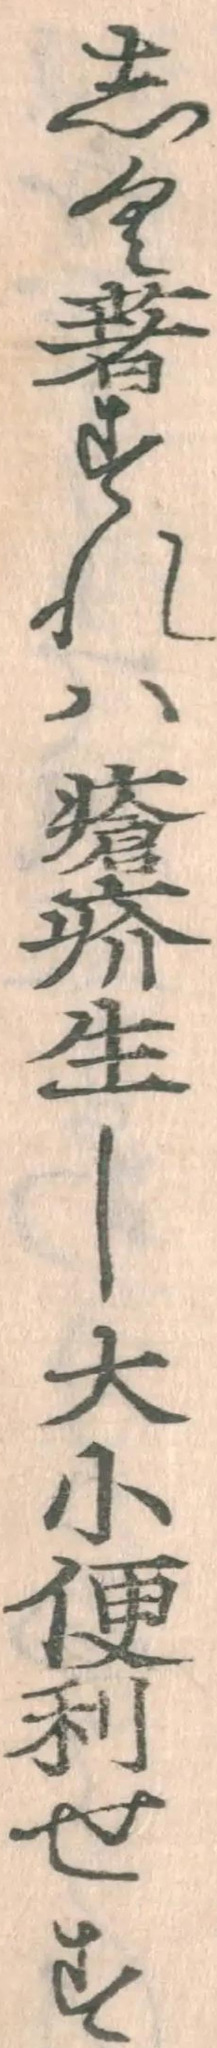しく著すれは瘡疥生し大小便利せす

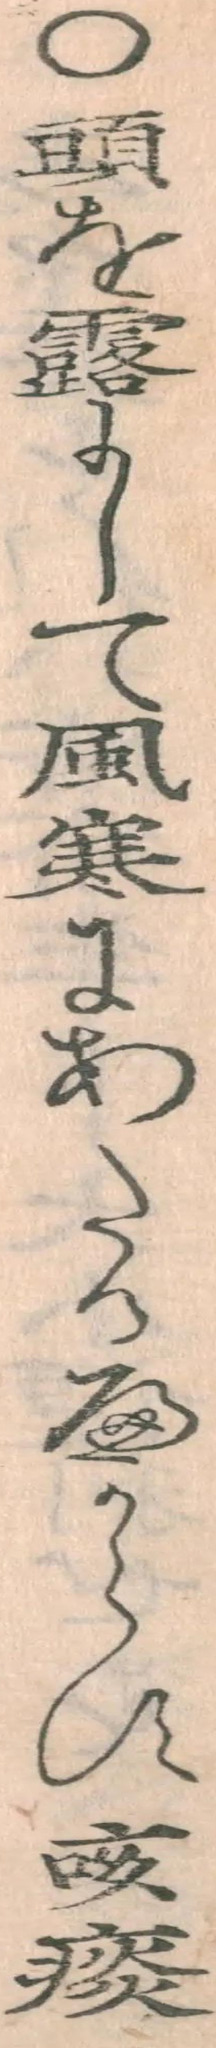〇頭を露にして風寒にあたるへからす咳痰
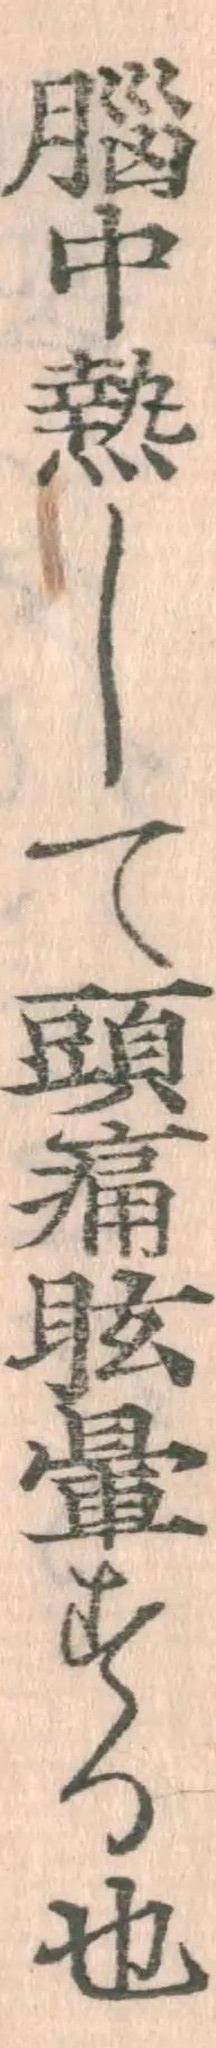脳中熱して頭痛眩暈する也
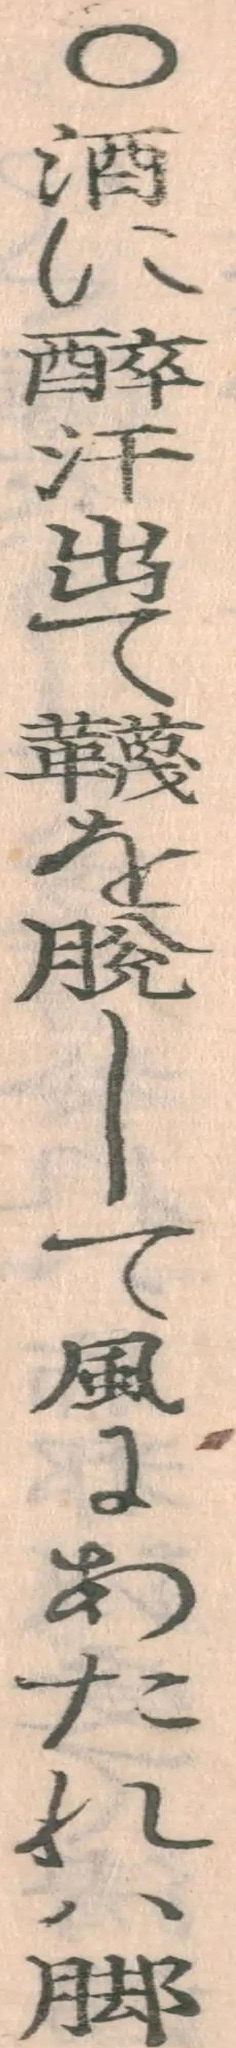〇酒に酔汗出て韈を脱して風にあたれは脚
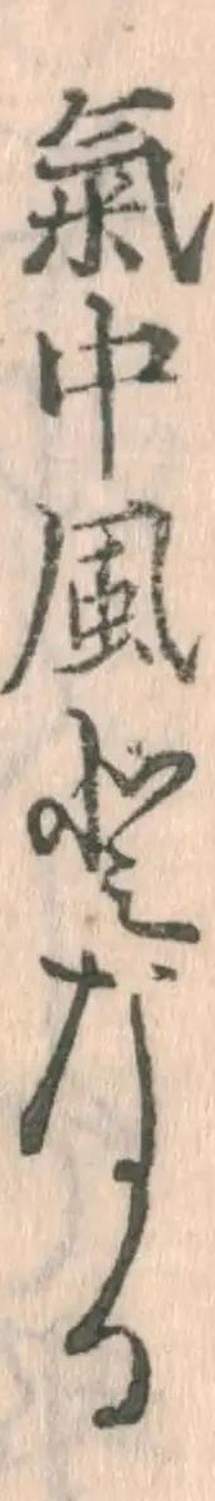気中風となる
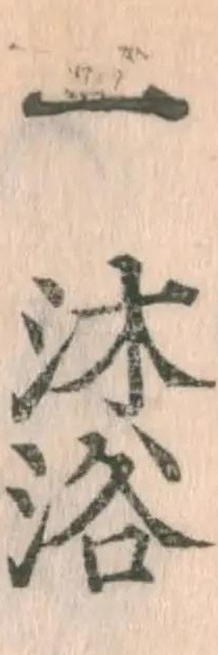一沐浴
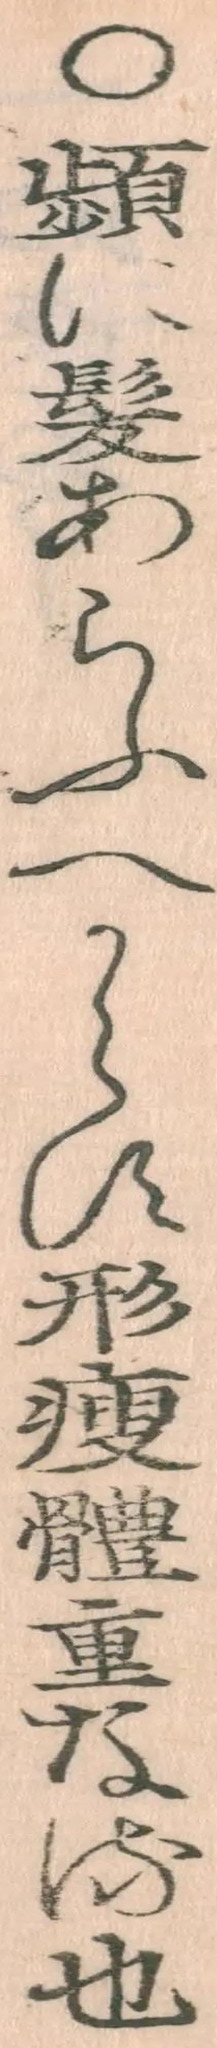〇頻に髪あらふへからす形痩体重なる也
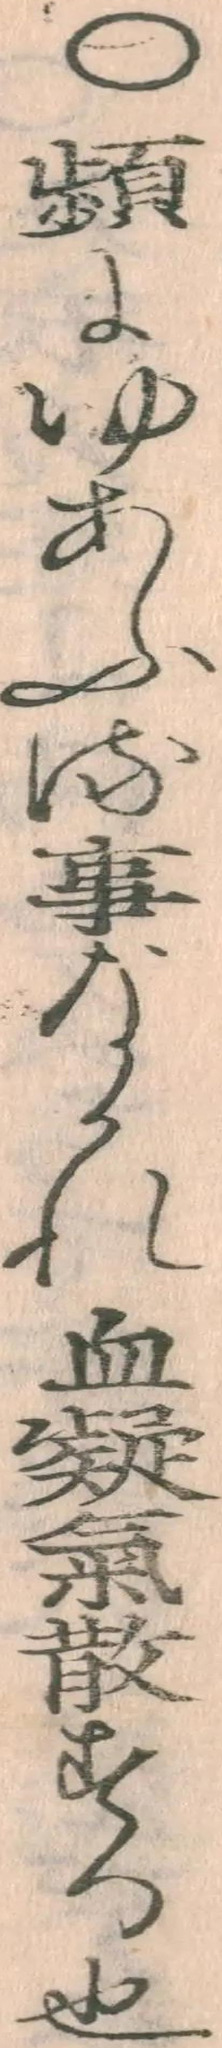〇頻にゆあふる事なかれ血凝気散する也
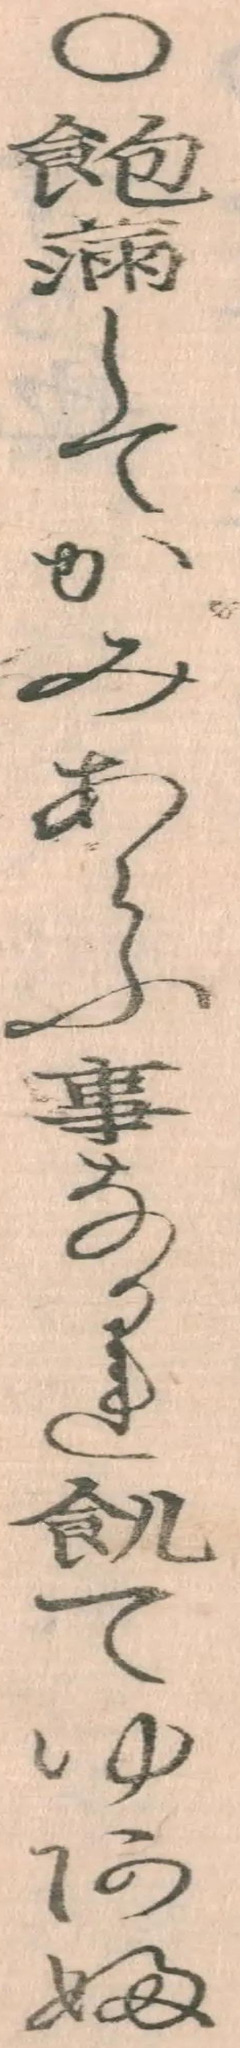〇飽満してかみあらふ事なかれ飢てゆあふ
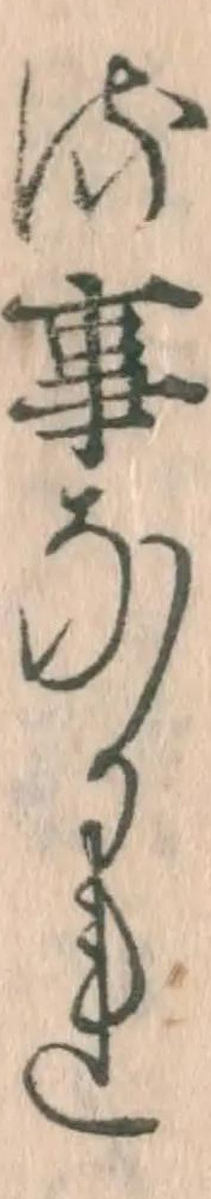る事なかれ
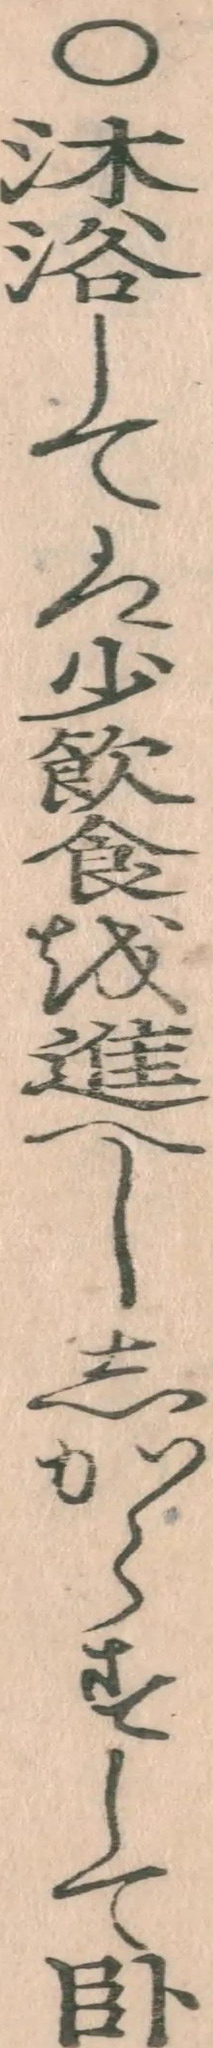〇沐浴しては少飲食を進へししからすして臥
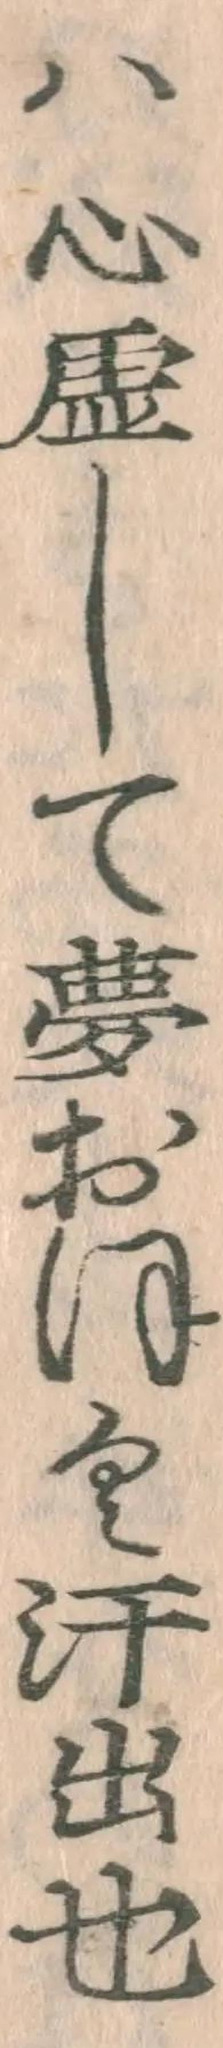は心虚して夢おほく汗出也
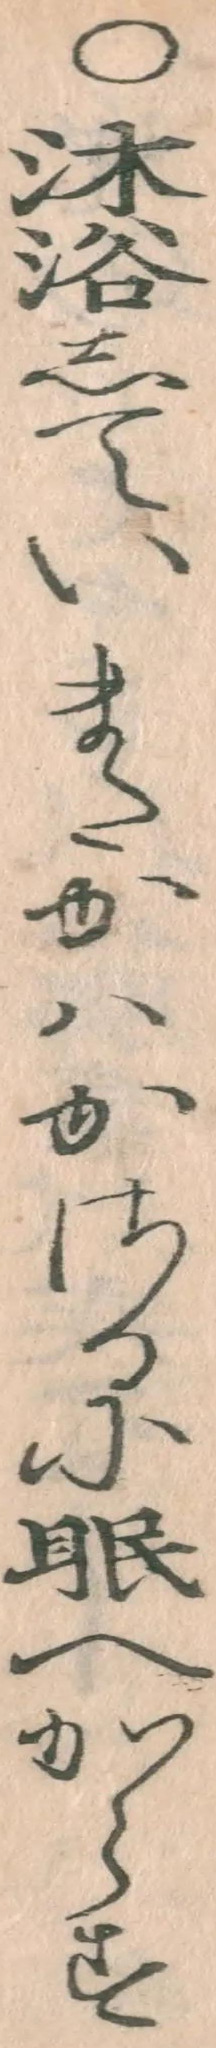〇沐浴していまたかはかさるに眠へからす
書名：延壽撮要
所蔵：国立国会図書館 National Diet Library, JAPAN
